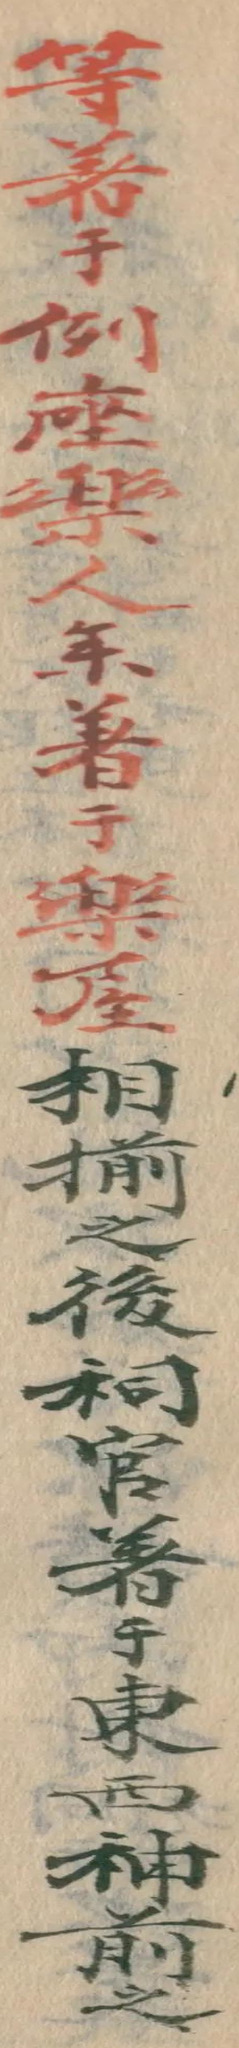等着于例座楽人参着于楽屋相揃之後祠官着于東西神前之

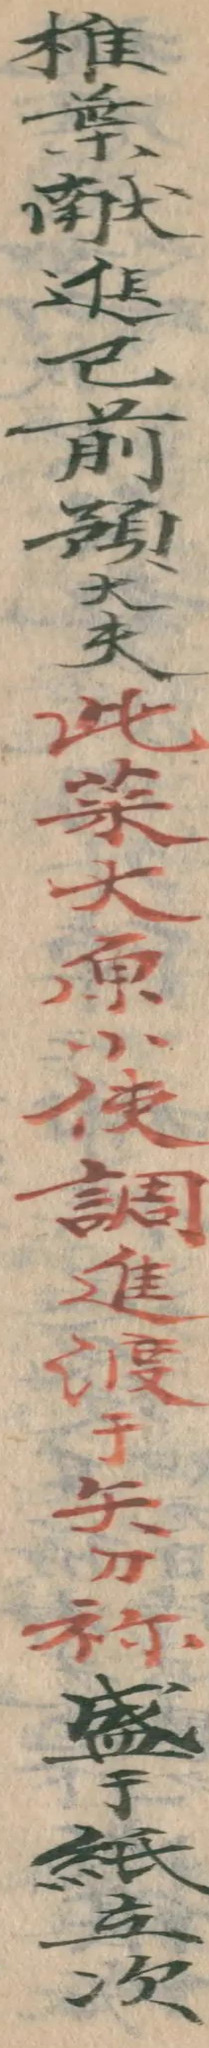椎葉献進已前預大夫此菜大原小使調進渡于矢刀祢盛于紙立次
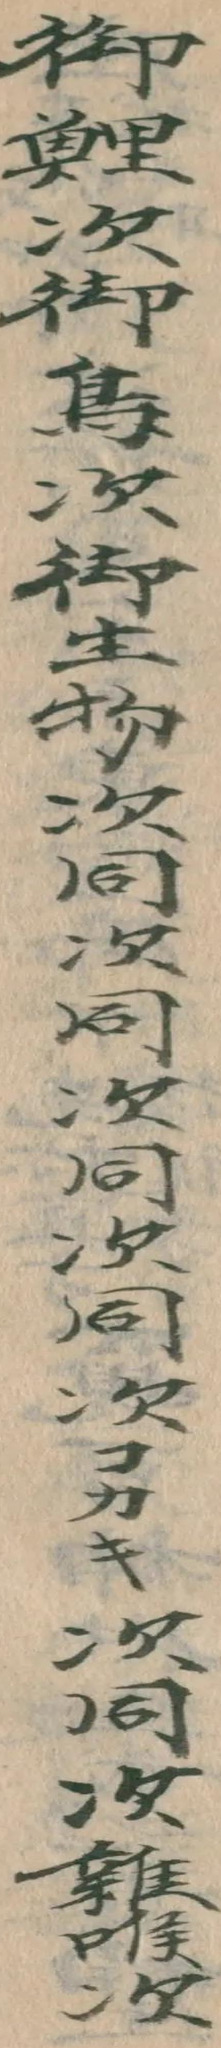御鯉次御鳥次御生物次同次同次同次同次コカキ次同次雑喉次
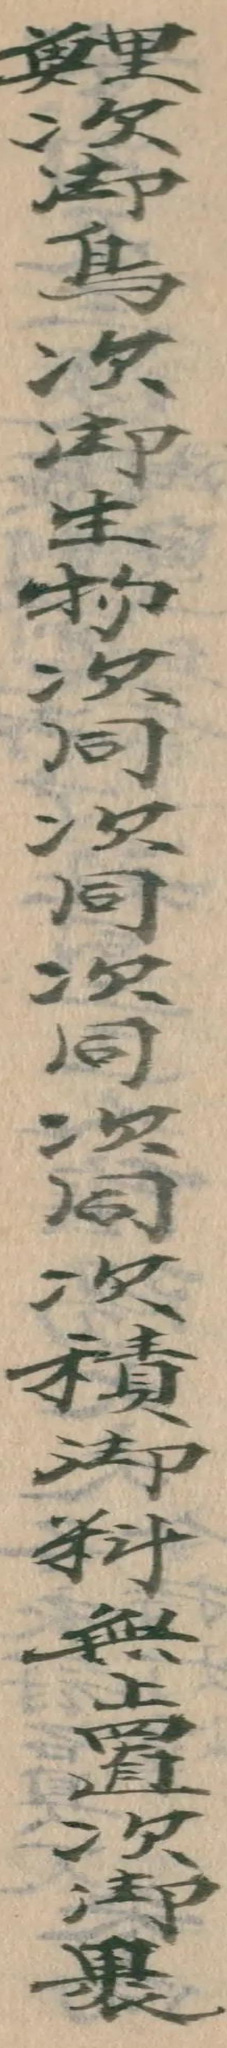鯉次御鳥次御生物次同次同次同次同次積御料無上置次御裹
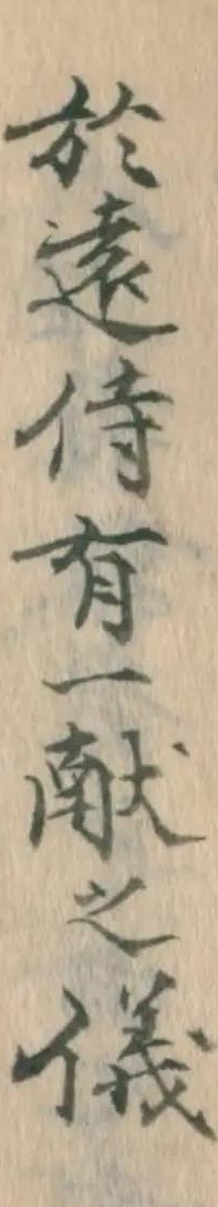於遠侍有一献之儀

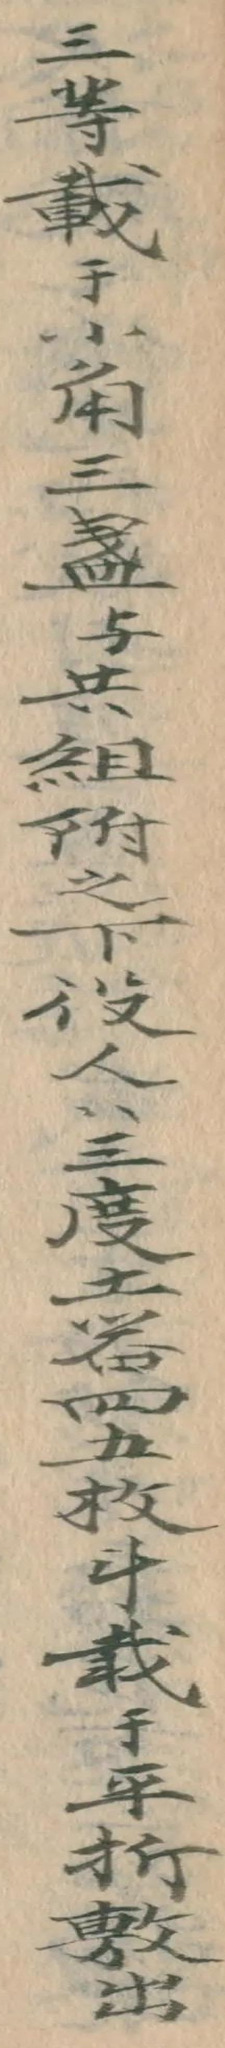三等載于小角三盞与共組附之下役人ハ三度土器四五枚計載于平折敷出
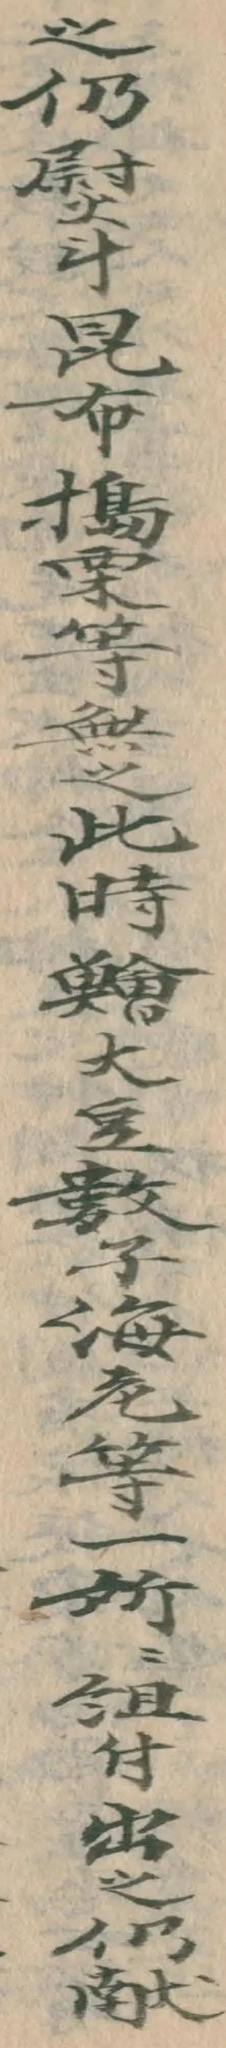之仍熨斗昆布搗栗等無之此時鱠大豆数子海老等一所ニ組付出之仍献
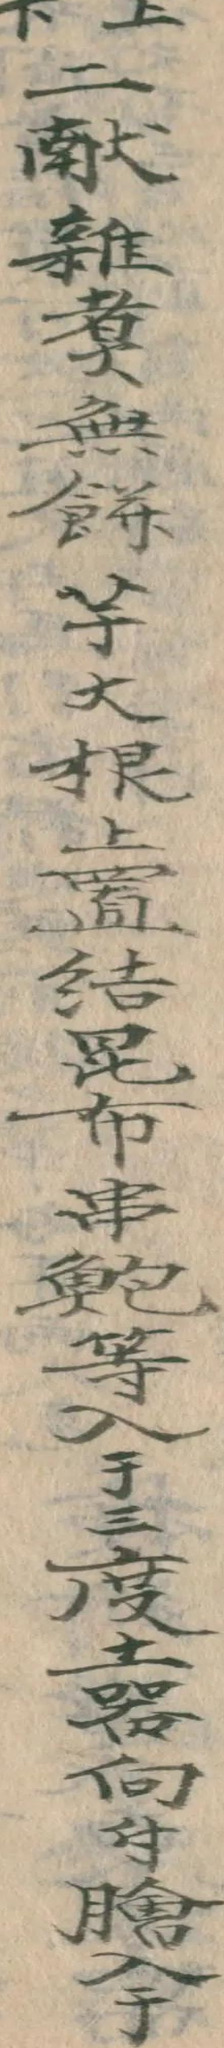上下二献雑煮無餅芋大根上置結昆布串鮑等入于三度土器向付膾入于
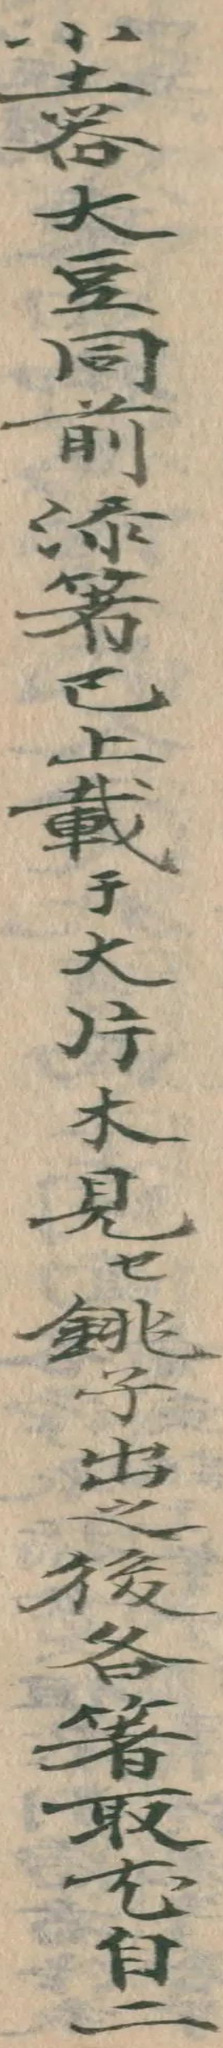小土器大豆同前添箸已上載于大片木見セ銚子出之後各箸取尤自二
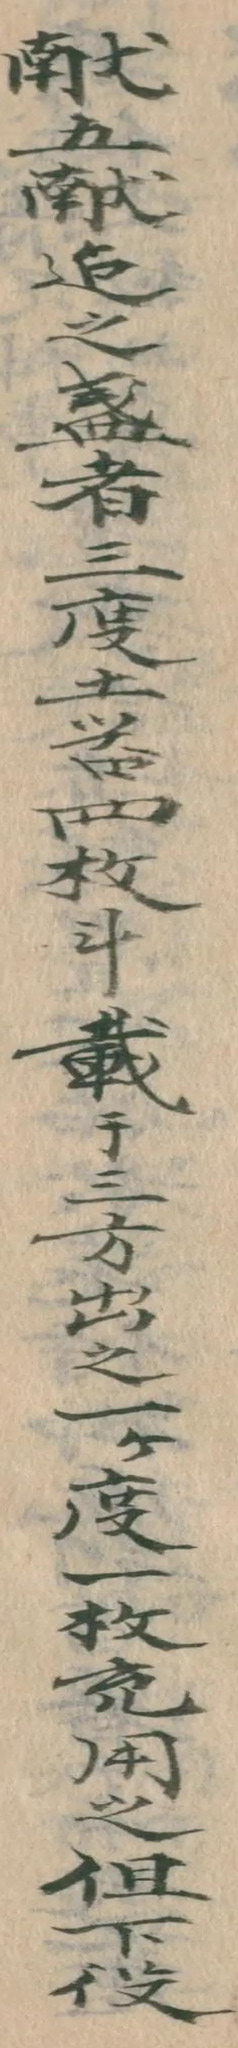献五献迄之盞者三度土器四枚計載于三方出之一ケ度一枚充用之但下役
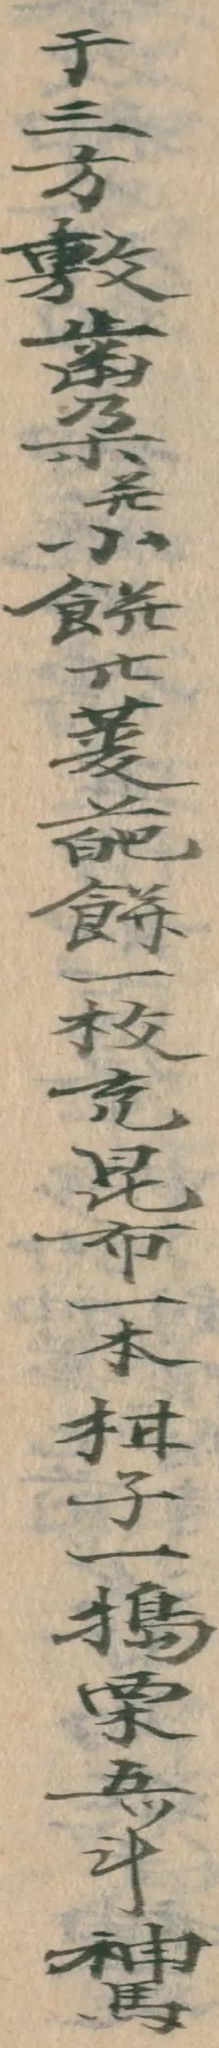于三方敷歯朶并小餅廿菱葩餅一枚充昆布一本柑子一搗栗五ツ計神馬
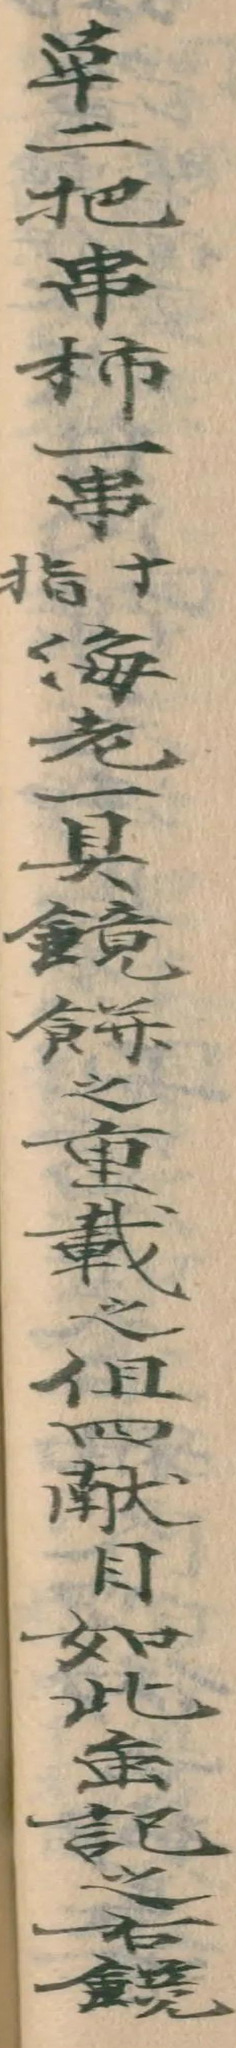草二把串柿一串十指海老一具鏡餅之重載之但四献目如此雖記之右鏡
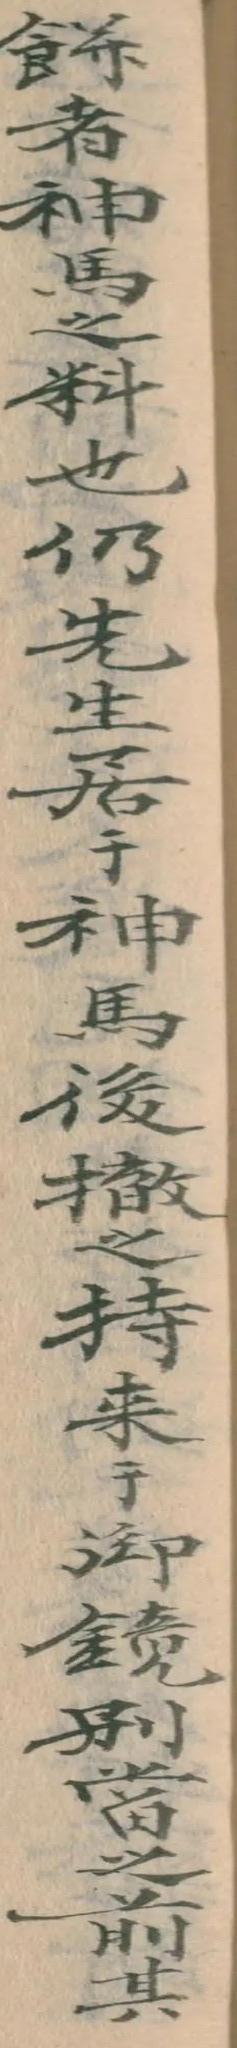餅者神馬之料也仍先生居于神馬後撤之持来于御鏡別当之前其
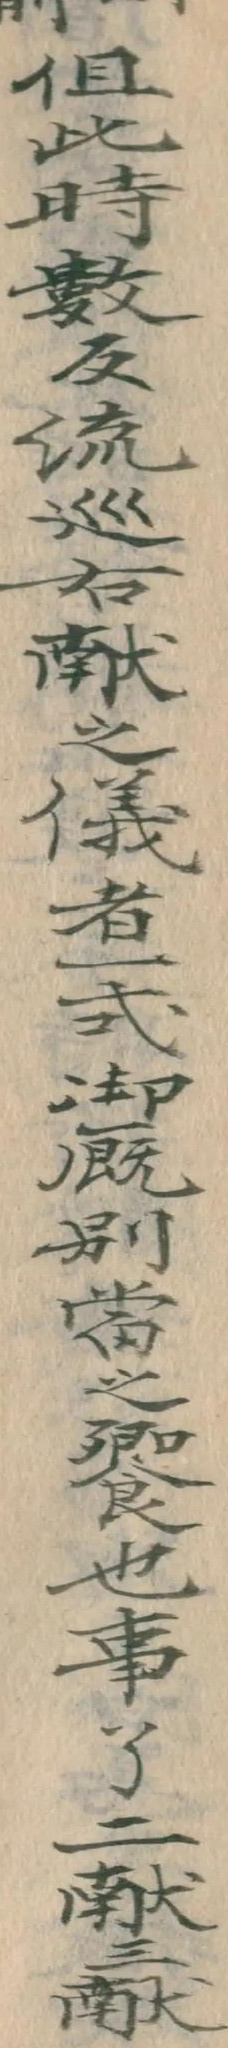同前但此時数反流巡右献之儀者一式御厩別当之饗也事了二献三献
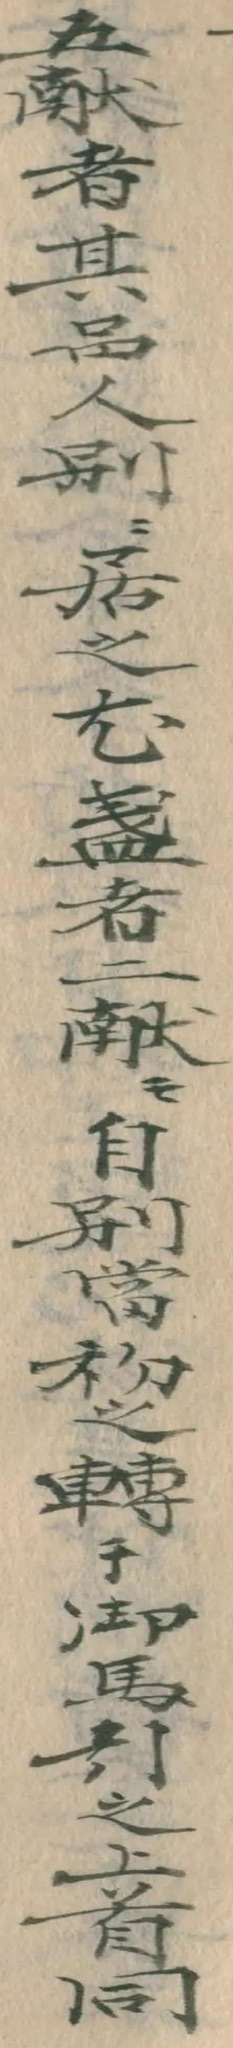五献者其品人別ニ居之尤盞者二献モ自別当初之転于御馬引之上首同
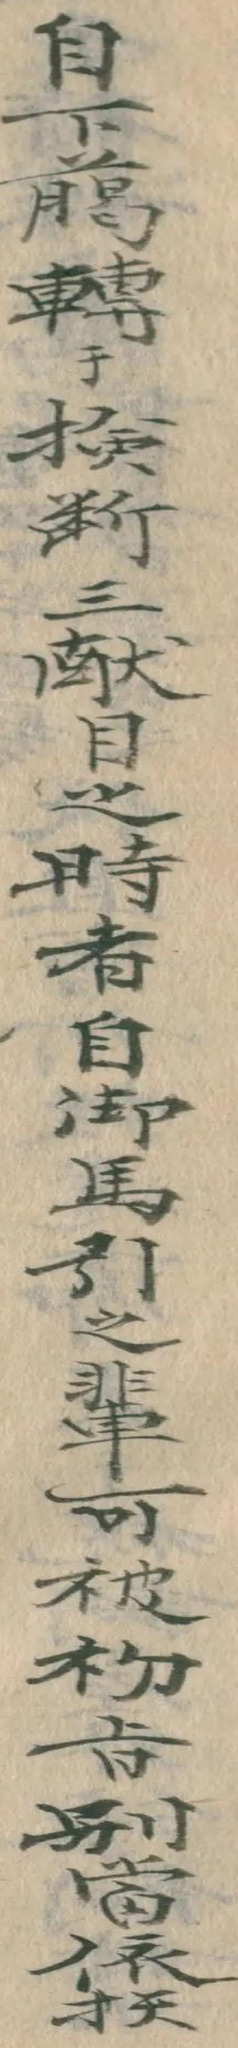自下臈転于検断三献目之時者自御馬引之輩可被初旨別当依挨
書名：賀茂社記録. 第9冊
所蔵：国立国会図書館 National Diet Library, JAPAN
